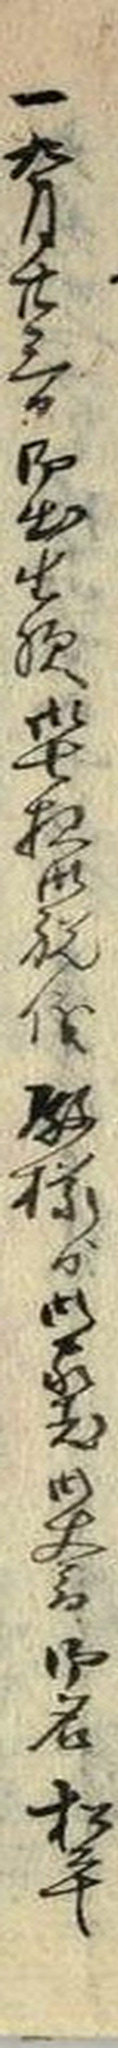一九月廿三日御出生様御七夜御祝儀殿様ゟ御家老御使ニ而御名松平
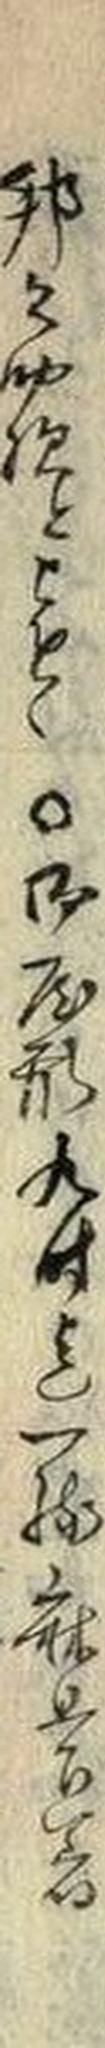邦之助様と被進候〇御屋形九時迄一統麻上下着
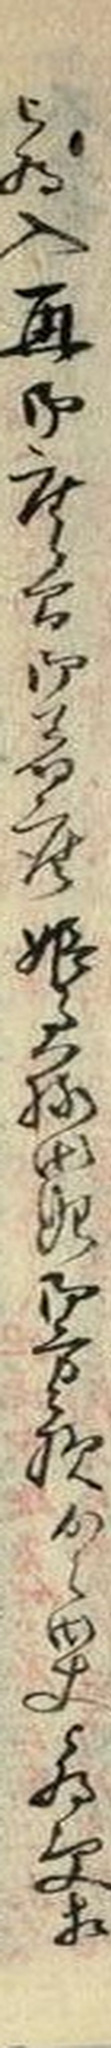被為入再御座之間御着座姫君様御始御方々様ゟ之御使被為受相
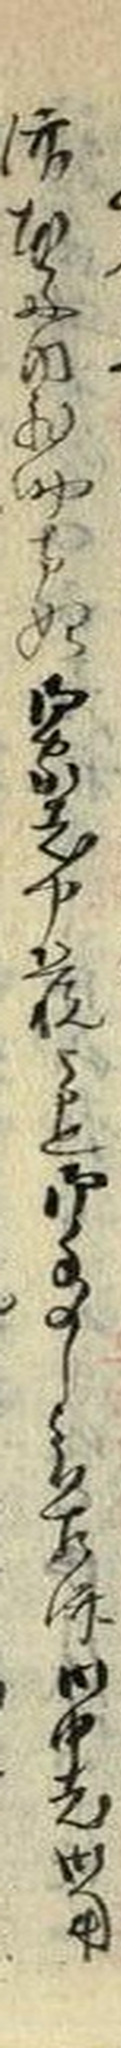済本多内蔵助方始御家老中恐悦被申上御手のし被下相済御中老御用
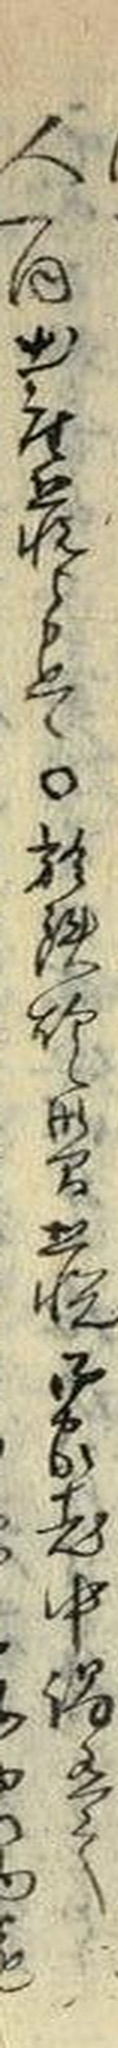人一同出座恐悦被申上候〇於鉄炮之御間恐悦御家老中謁有之
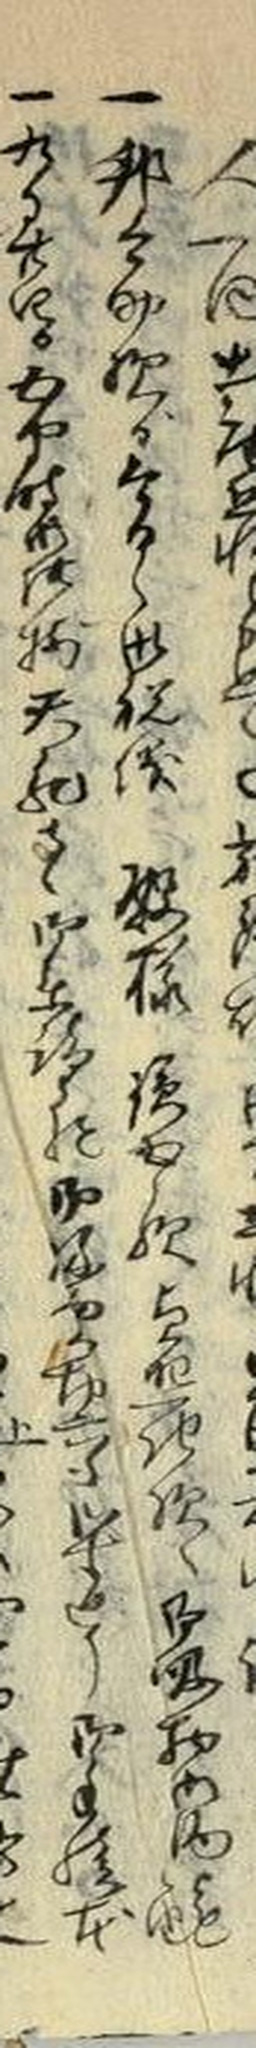一九月廿四日五半時御供揃天龍寺へ御参詣被遊御帰殿切六ツ弐寸廻り御手続本
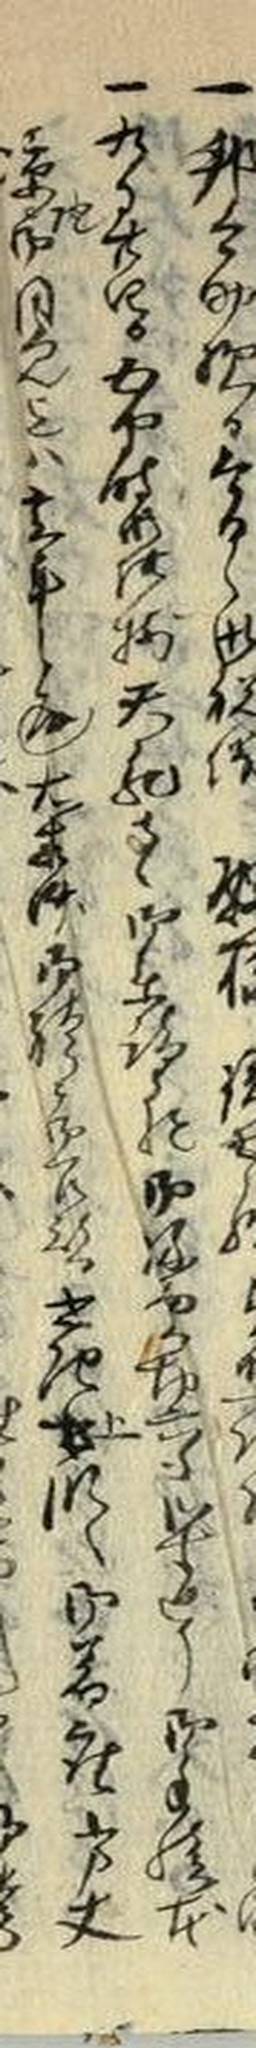涼院御目見迄ハ亥年之通右相済御袴ニ御召替書院上段へ御着座方丈
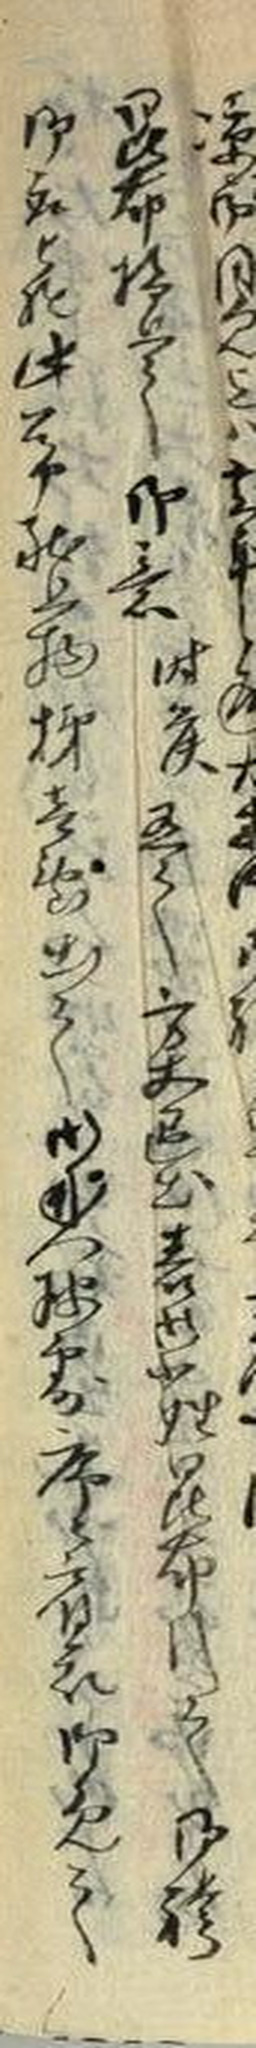御取被遊此節献上物柿壱台出之御用人披露序ニ肩衣御免之
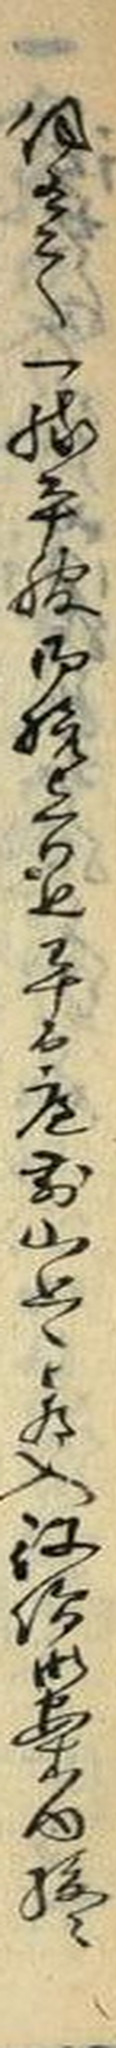伺有之一統平服御膳被召上畢而庭前山上へ被為入役僧御案内緩々
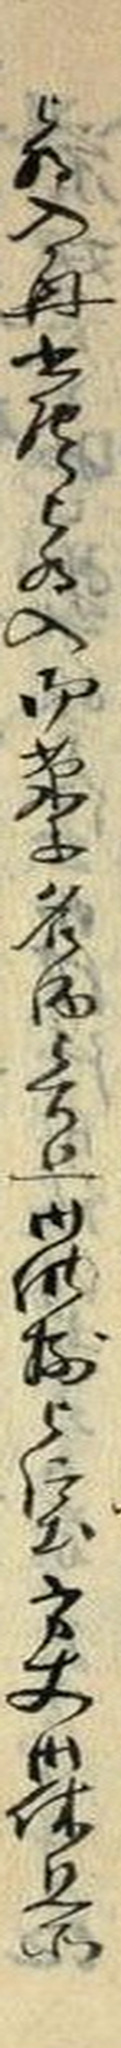被為入再書院へ被為入御菓子名酒被召上御供揃被仰出方丈御休息所
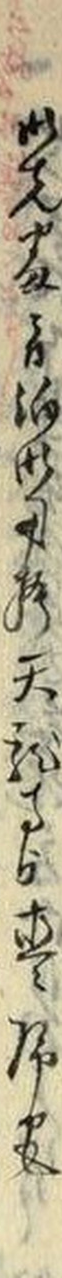御先番ニ付泊御用捨天龍寺ゟ直ニ帰宅
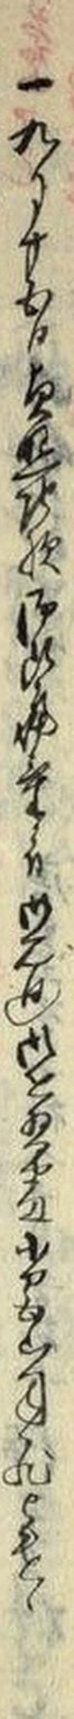一九月廿五日貞照院様御頭痛気ニ付御見廻御近習番小宮山周蔵被遣候
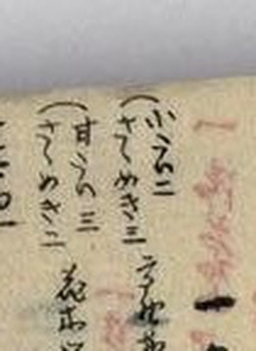さゝめき十
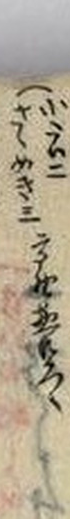さゝめき三高野惣左衛門へ
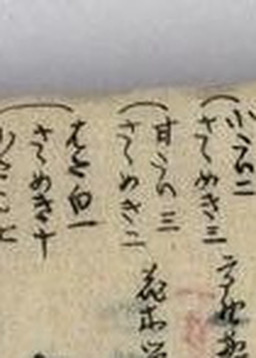さゝめき十
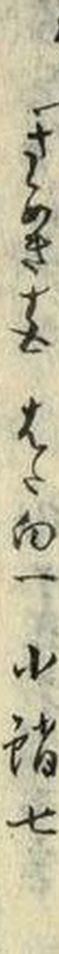さゝめき十五はた白一小蛸七
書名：少傅日録抄（斉承付側向頭取日記、在国）
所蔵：福井県文書館 Fukui Prefectural Archives
